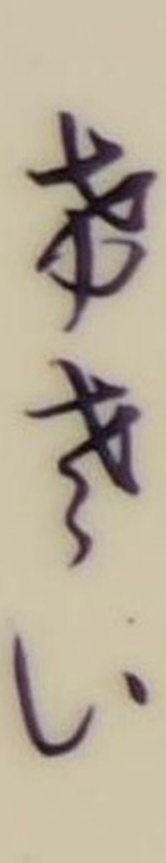けさい
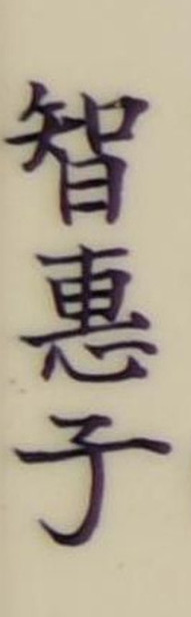智恵子

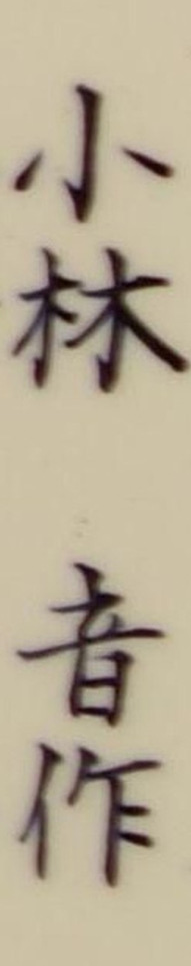小林音作
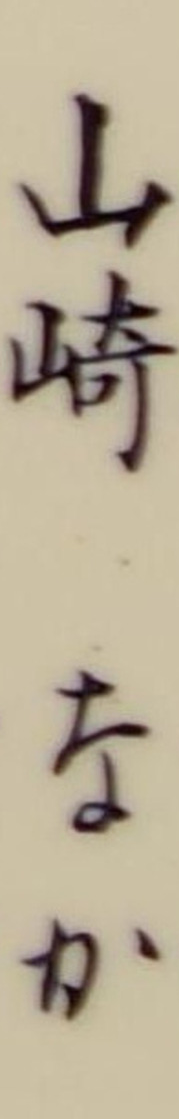山崎なか
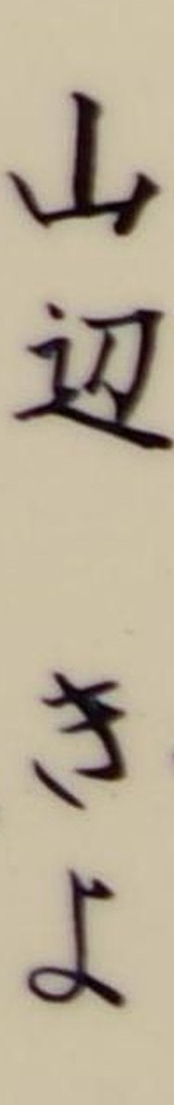山辺きよ
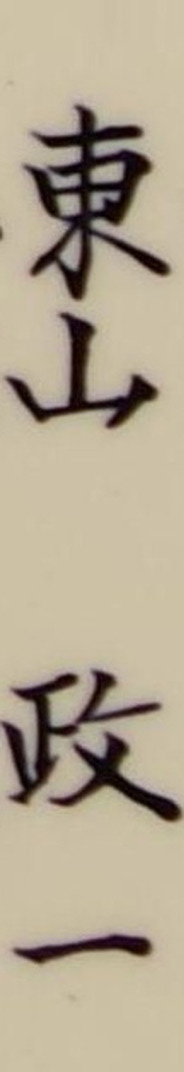東山政一
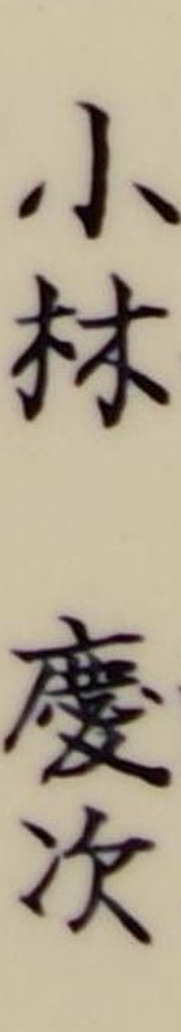小林慶次
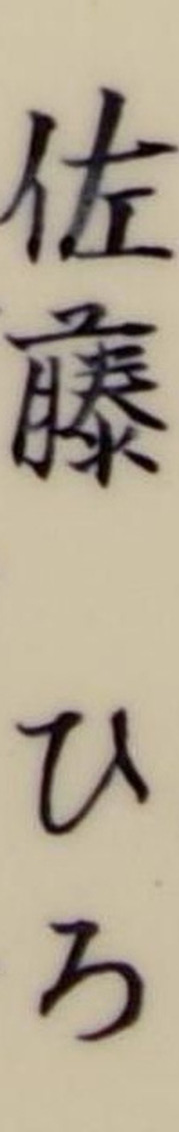佐藤ひろ
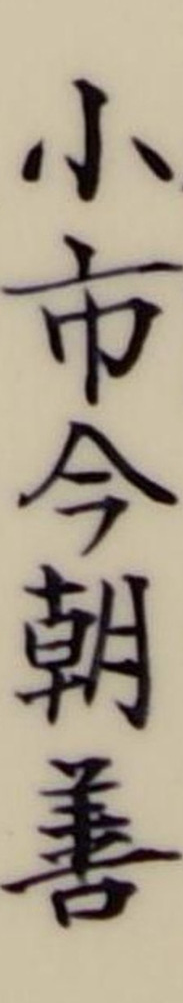小市今朝善
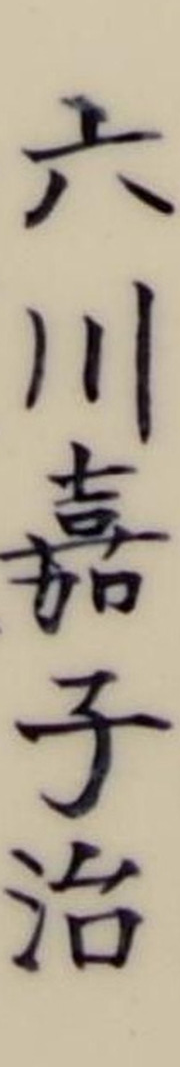六川嘉子治
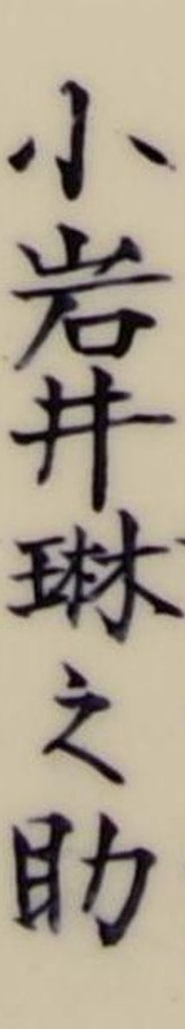小岩井琳之助
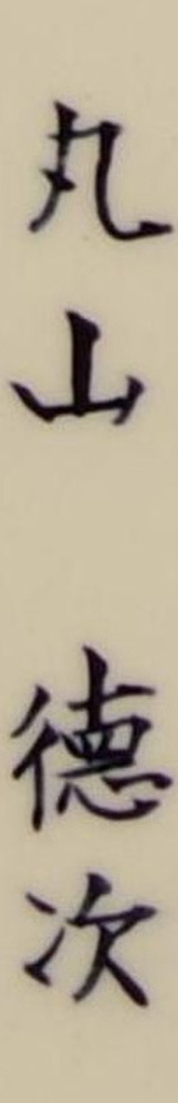丸山徳次
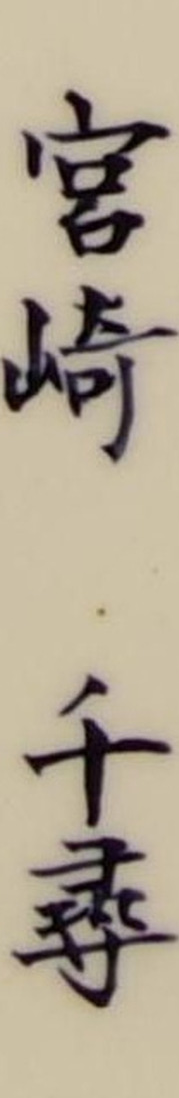宮崎千尋
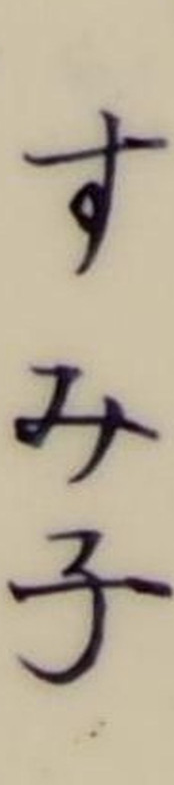すみ子
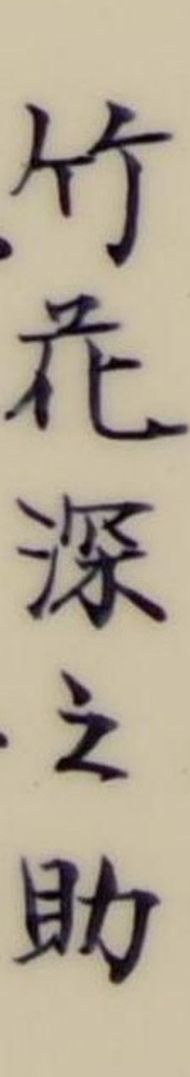竹花深之助
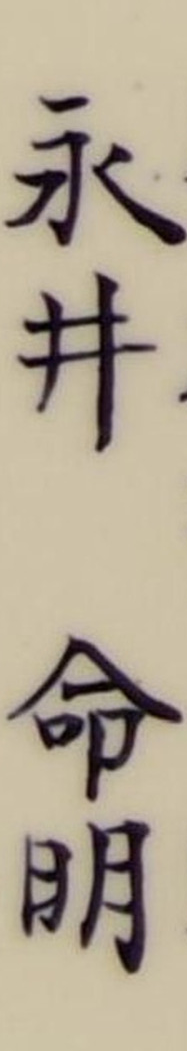永井命明
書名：E~L
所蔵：高野山金剛峯寺
